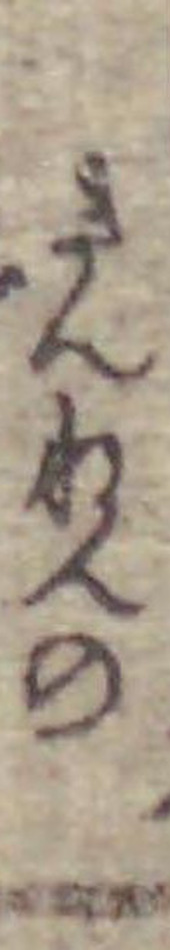きんねんの
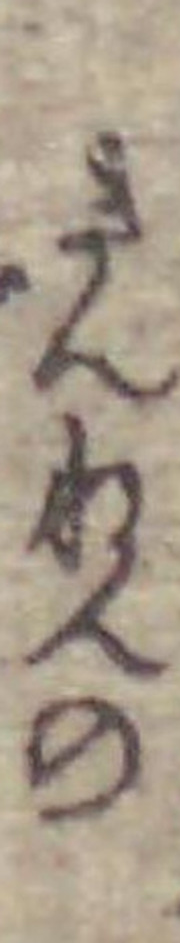きんねんの
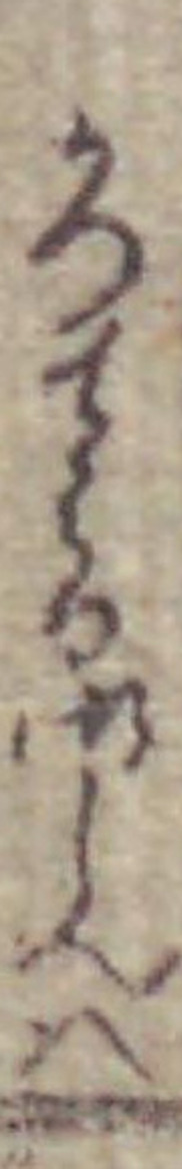かつてみる御しんは
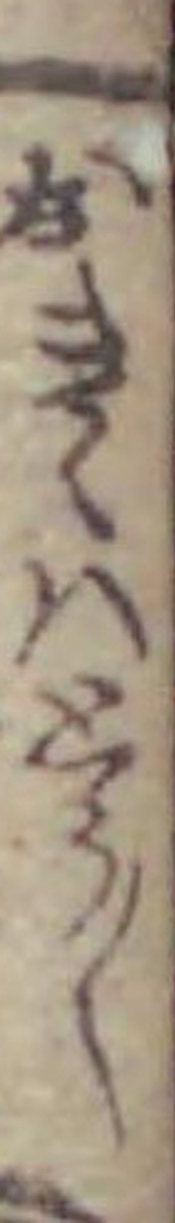おきくはとう〳〵
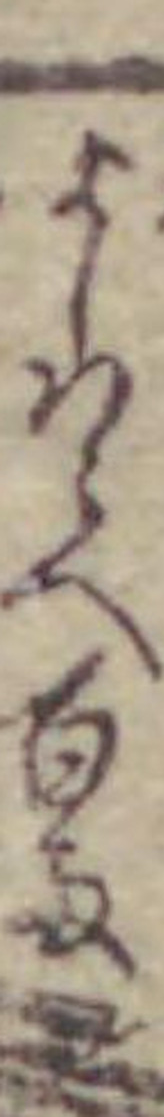よしはらへ百両
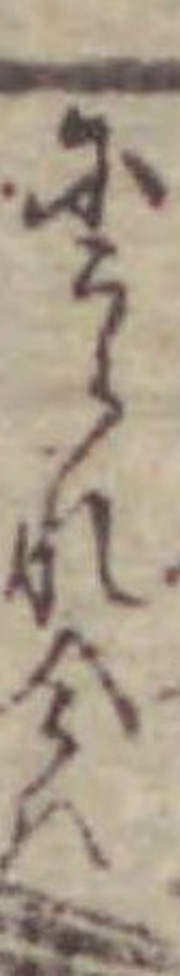にうられ今は
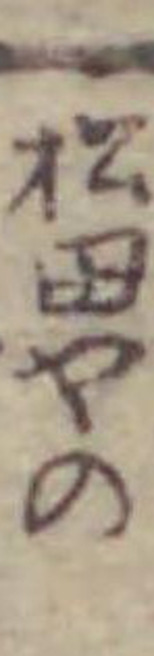松田やの
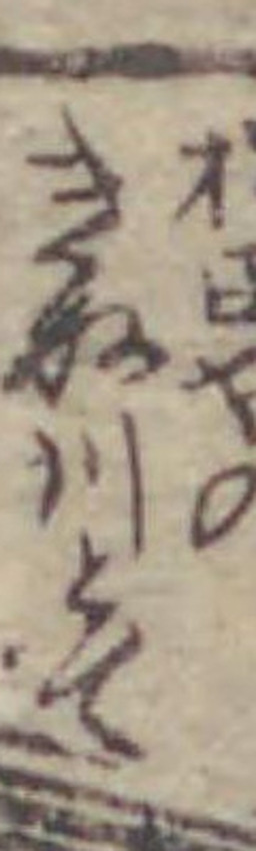きぬ川とて
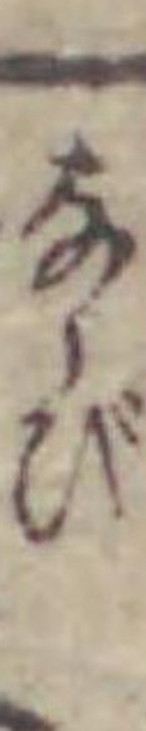ならび
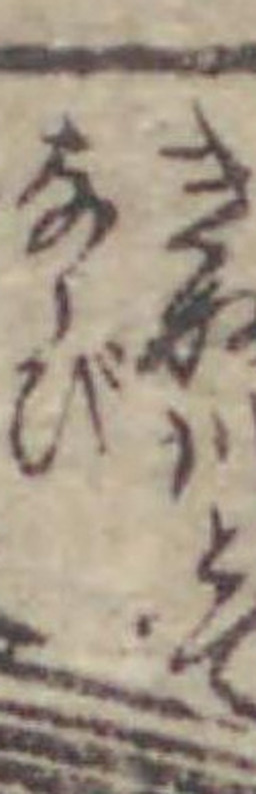ならび
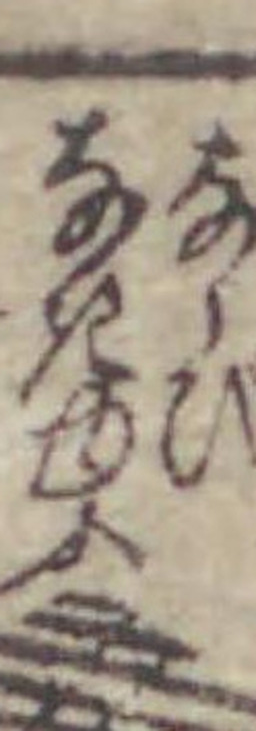なきゆふ
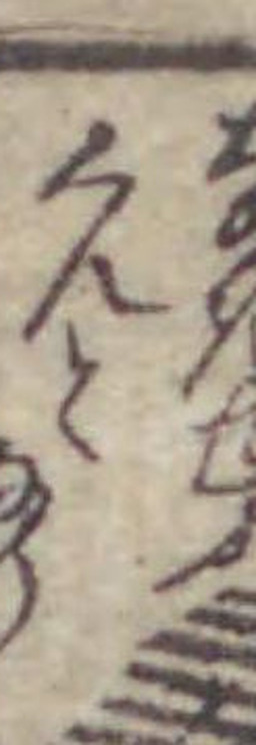くんとなり
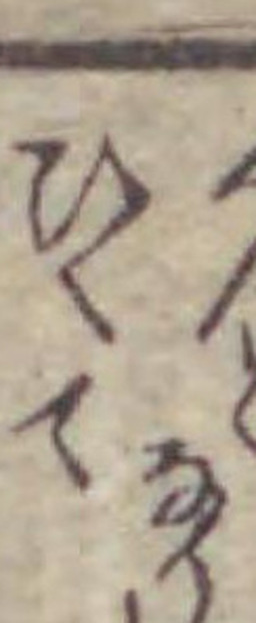ひくて
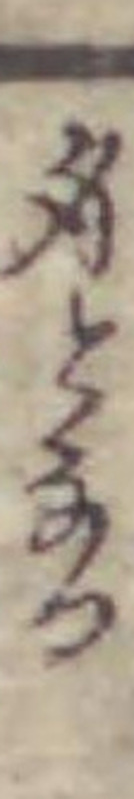身となる
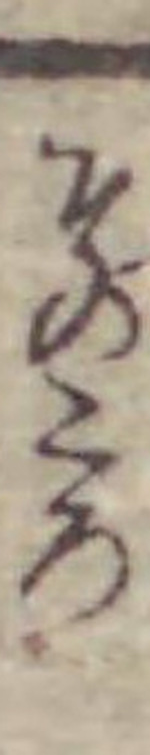そのころ
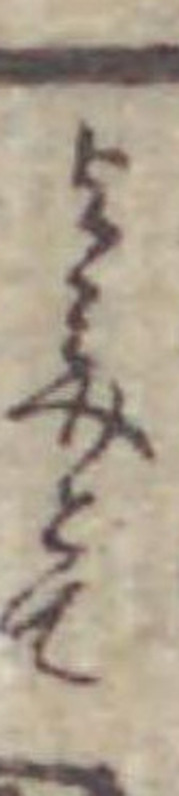与之介とて
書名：嗚呼不侭世之助噺 : 3巻
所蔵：国立国会図書館 National Diet Library, JAPAN
